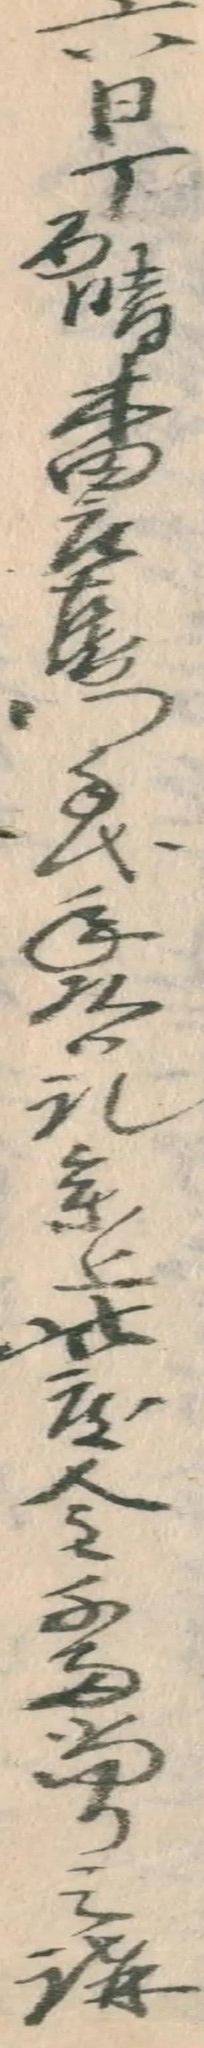六日丁卯晴木田庄左衛門手代年頭御礼参上此度金千両當り之講
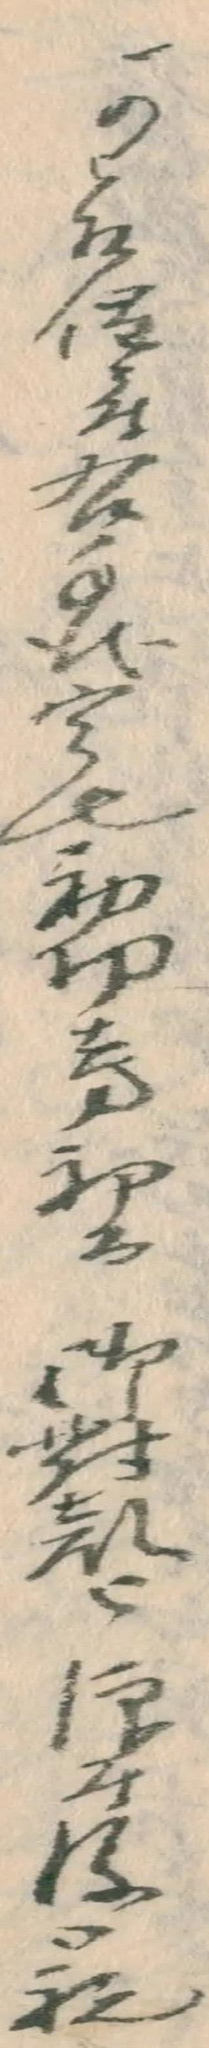可被相催ニ付右手代宇七勤功旁初而御對顔被仰付後御祝
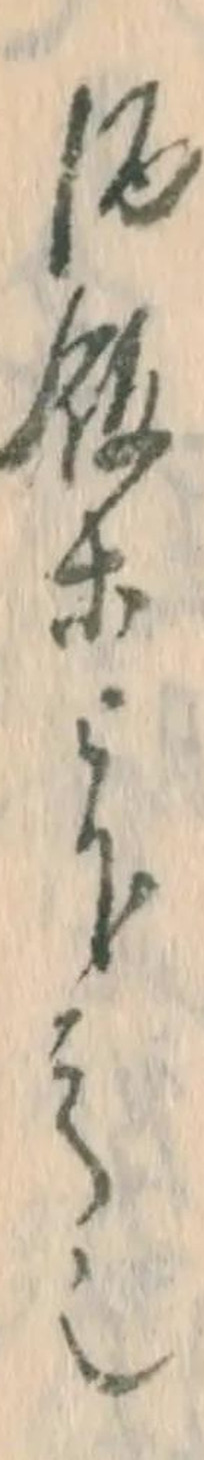酒飯等被下之也

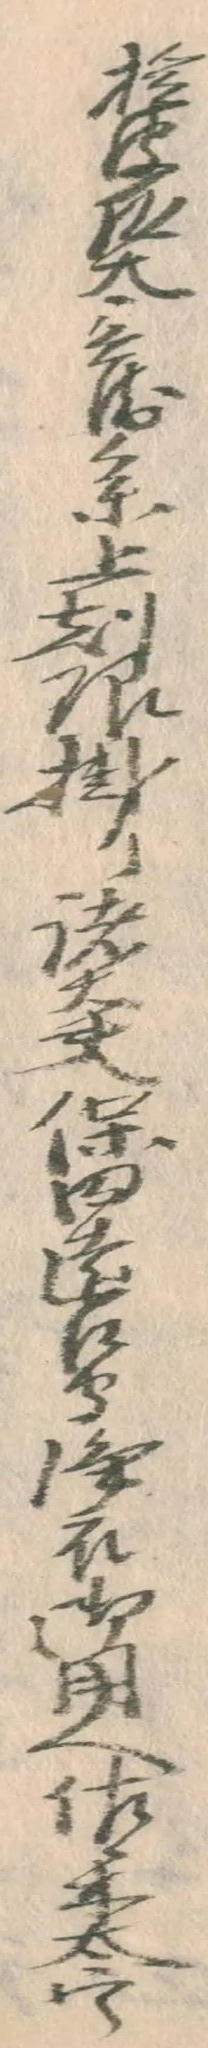檜皮太兵衛参上刻限掛り諸大夫保田遠江守浄衣御用人佐々木太宰
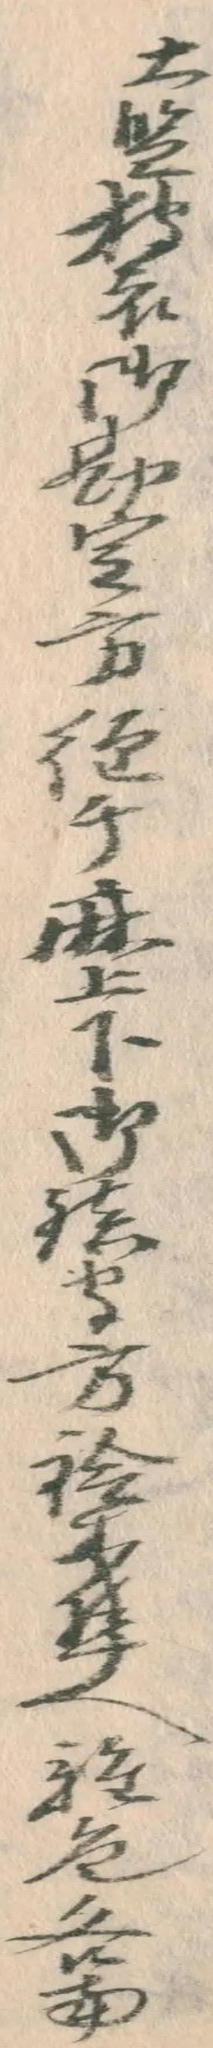大監狩衣御勘定方経千麻上下御鎮守方鈴木隼人雑色各面
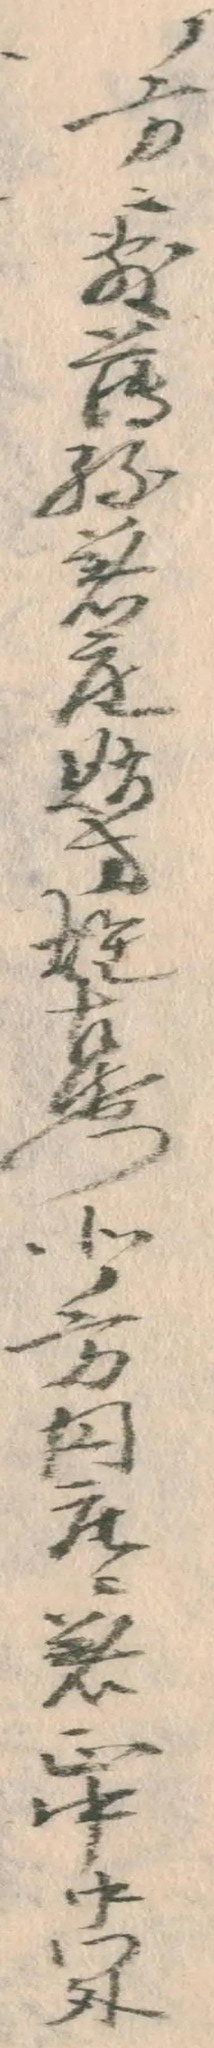ノ方ニ敷薄縁着座賄方権左衛門北ノ方円座ニ着正中中門外
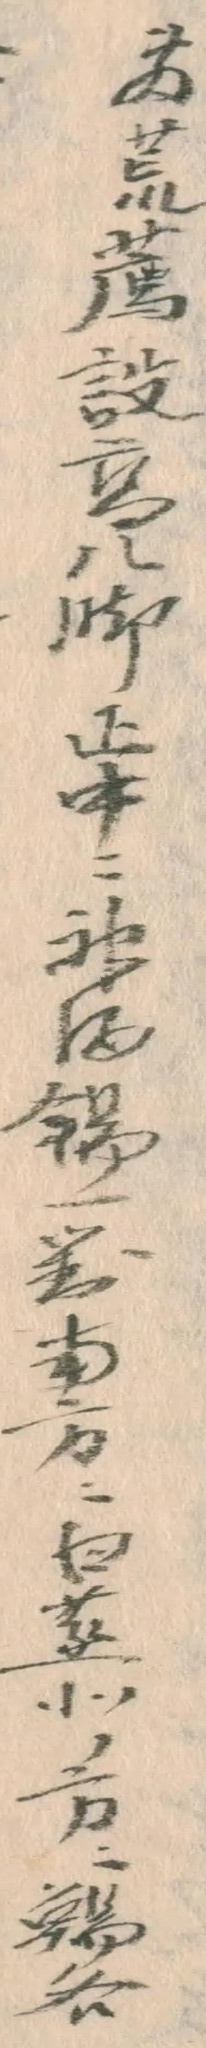敷荒薦設高八脚正中に神酒錫一對南方に白蒸北ノ方ニ鯣各
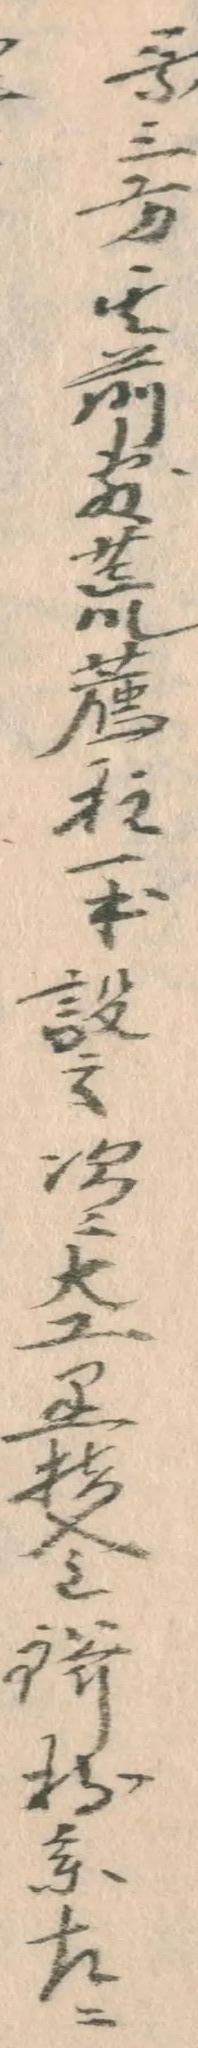乗三方其前敷荒薦柱一本設之次ニ大工黒指金斧持参左に
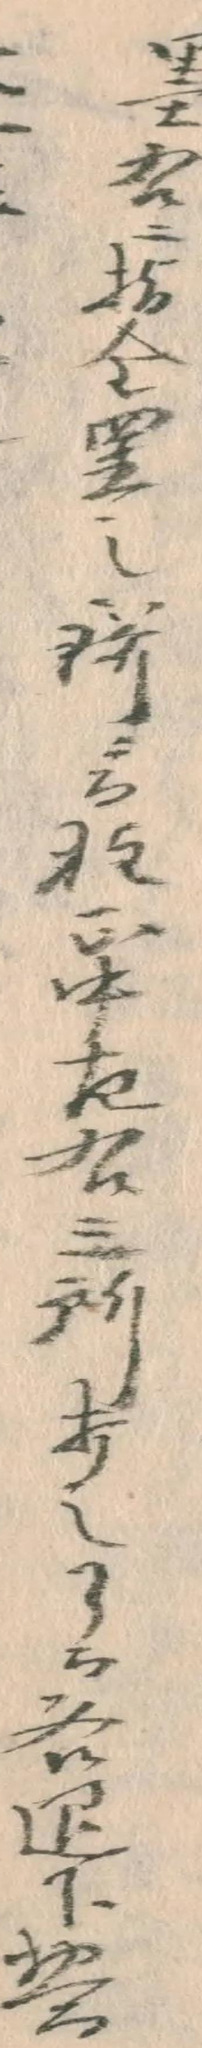墨右に指金置之斧ニ而柱正中左右三所打之了而各退下惣而
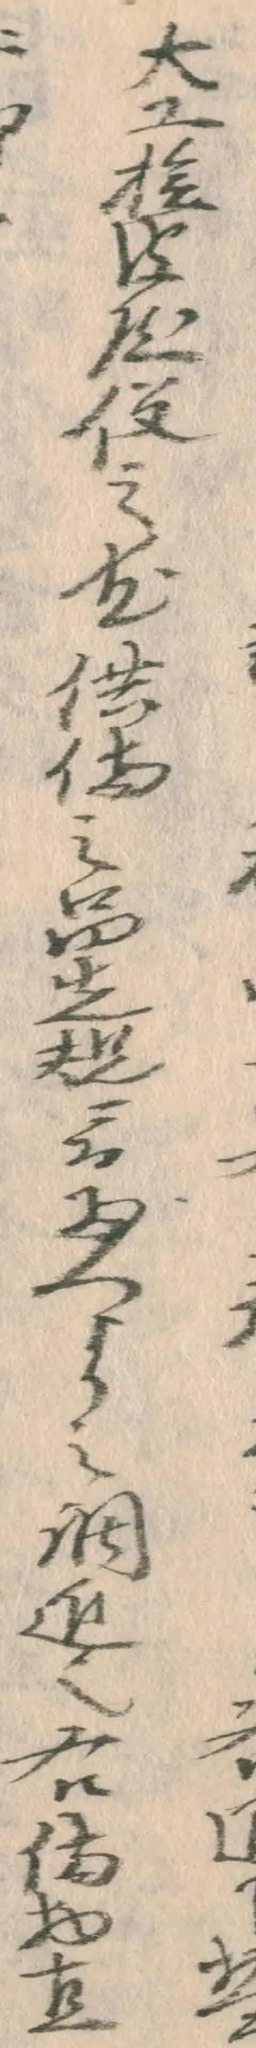大工檜皮屋役之尤供侍之品先規ニ而両人より之調進也右備物直
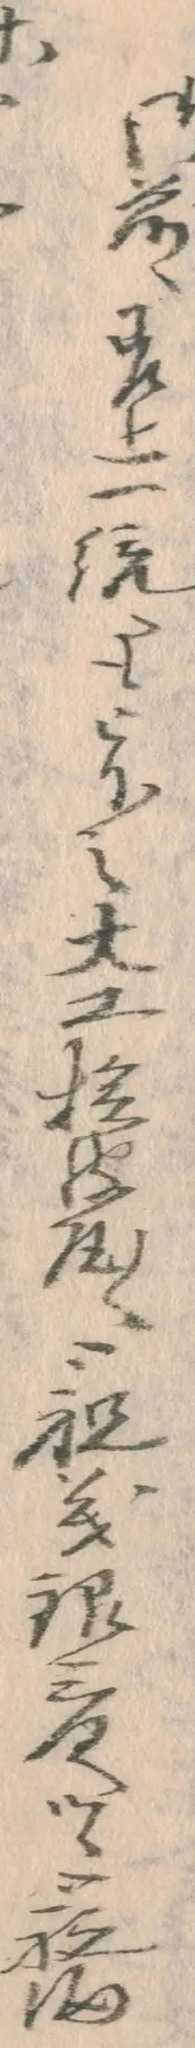ニ御前へ差上一統へも被下也大工檜皮屋へ御祝義銀三匁ツヽ御祝酒
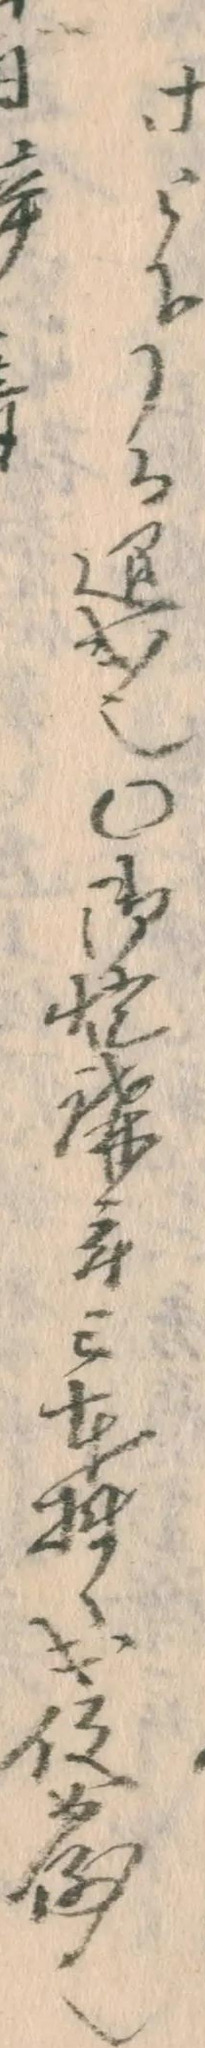等被下候而退出也○御燈講ニ付三本樹ヘ出役如例也
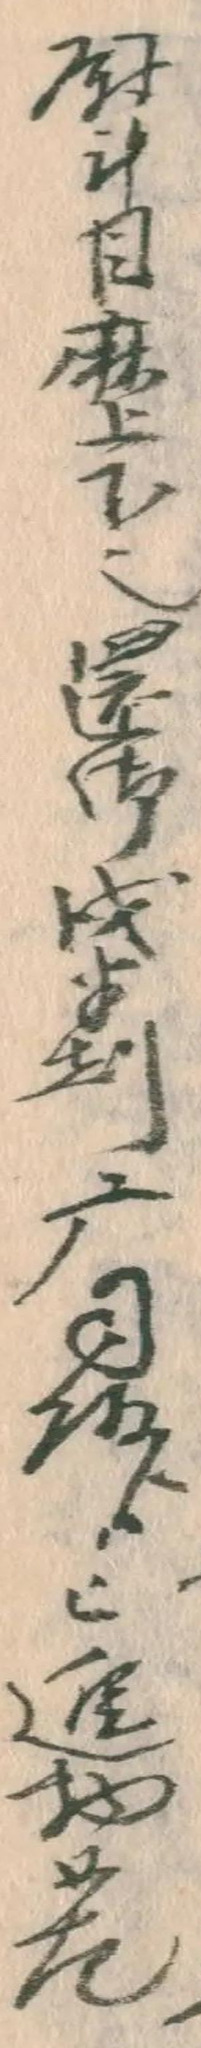尉斗目麻上下也還御戌半刻鷹司殿ゟ被進物如左
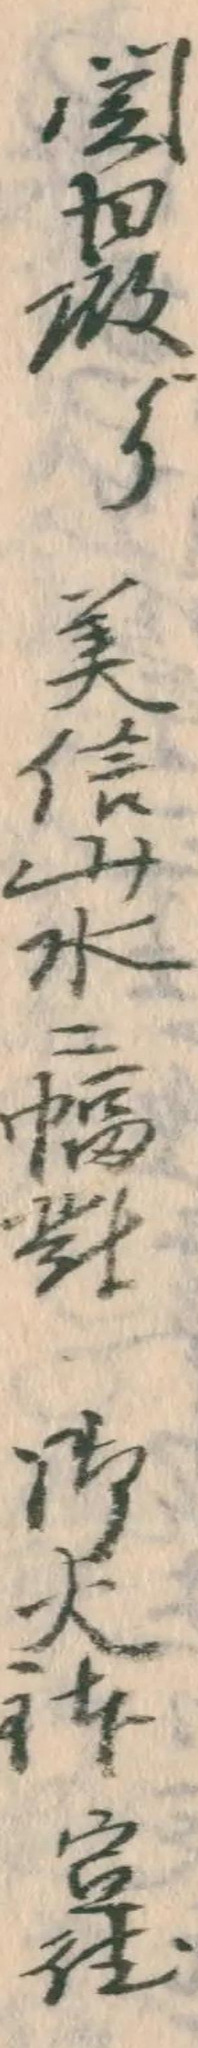関白殿より美信山水二幅對御火鉢宣往
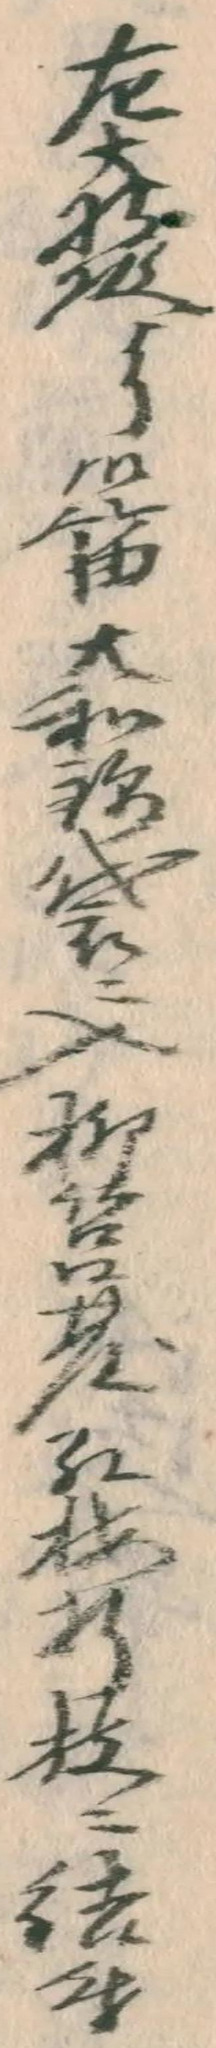左大将殿より御笛大和銘袋ニ入柳筥臺紅梅折枝ニ結付
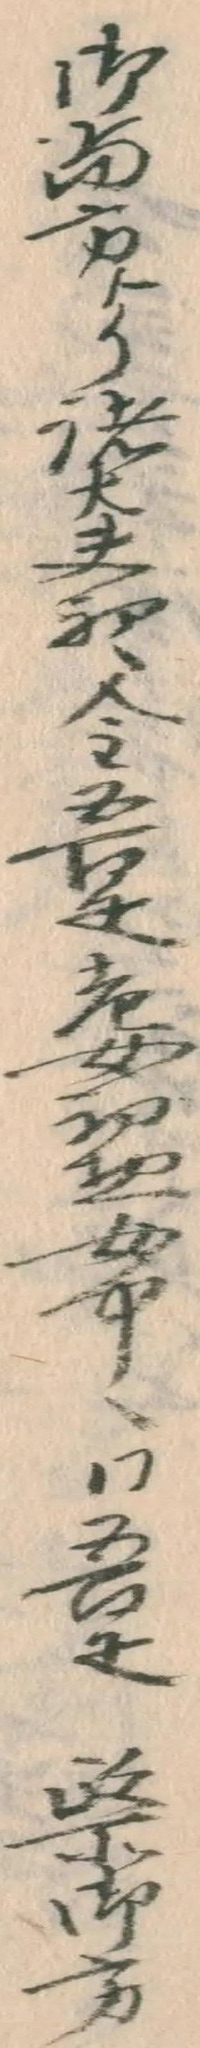御當方より諸大夫勤へ金五百疋老女初惣女中へ同五百疋政所御方
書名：賀茂社記録. 第70冊
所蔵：国立国会図書館 National Diet Library, JAPAN
